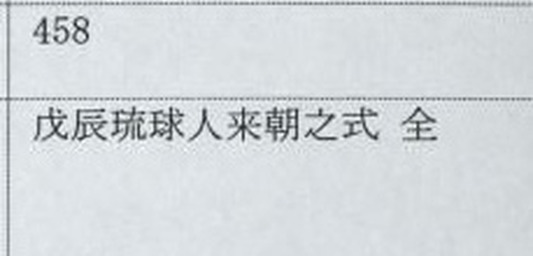戊辰琉球人来朝之式全
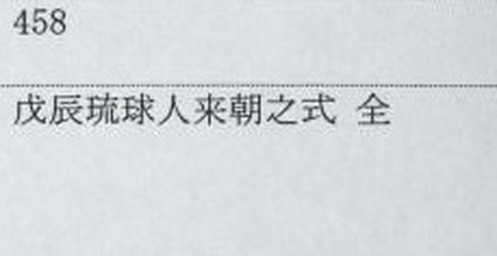戊辰琉球人来朝之式全
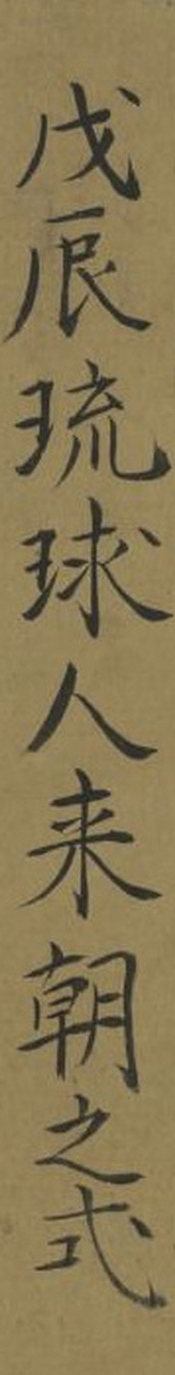戊辰琉球人来朝之式全

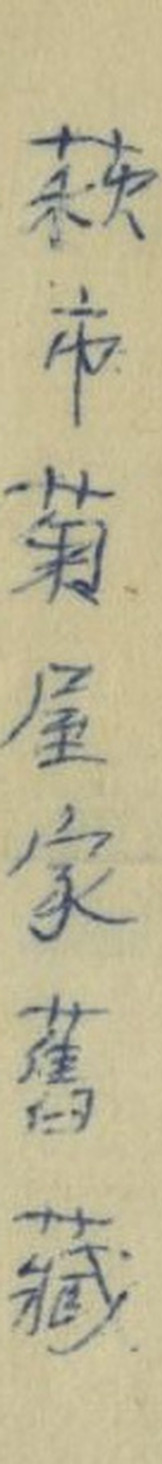萩市菊屋家旧蔵
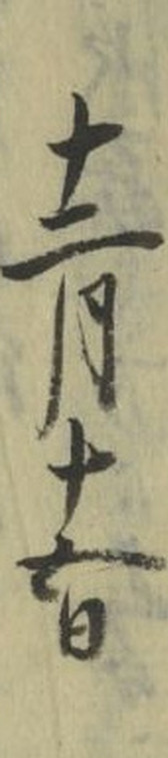十二月十五日
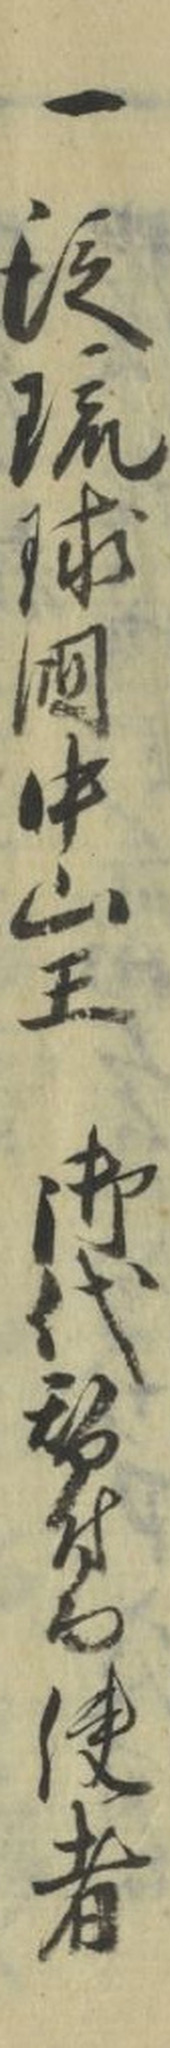一従琉球国中山王御代替付て使者
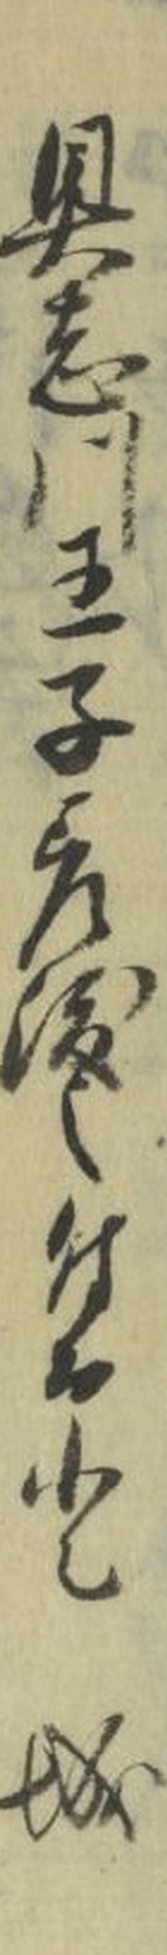具志川王子差渡之付て登城
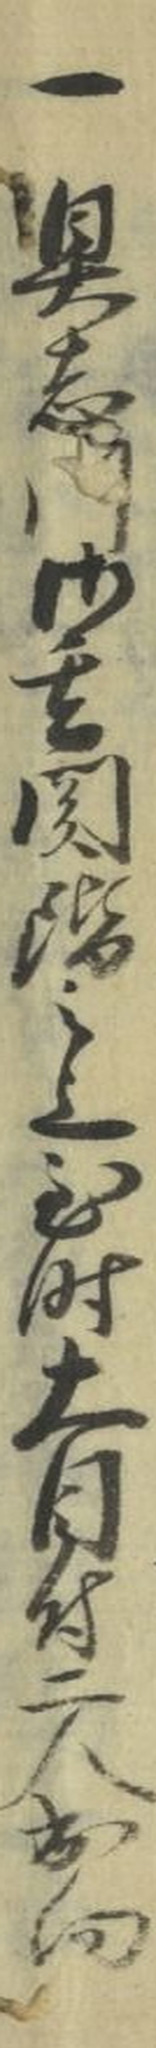一具志川御玄関階之上至時大目付二人出向
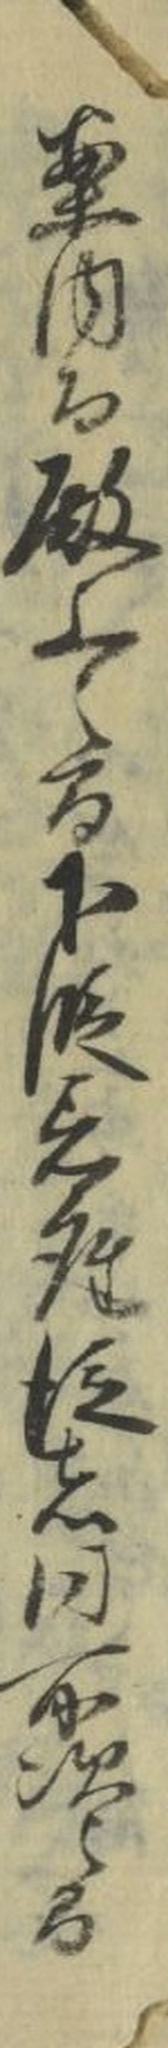案内而殿上之間下段着座従者同所次之間
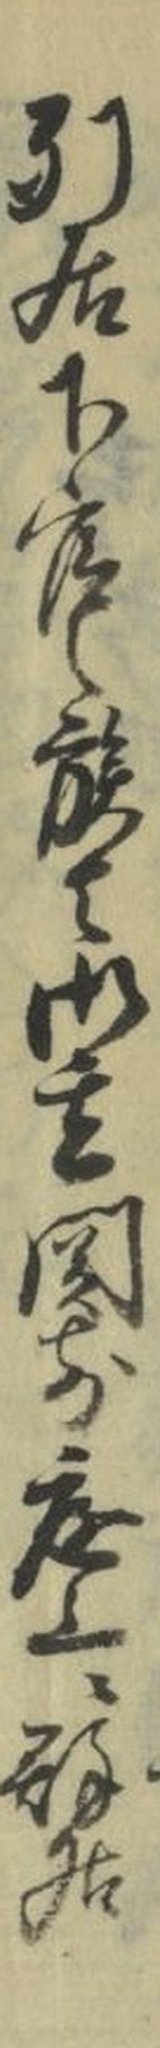列居下官之族は御玄関前庭上に群居
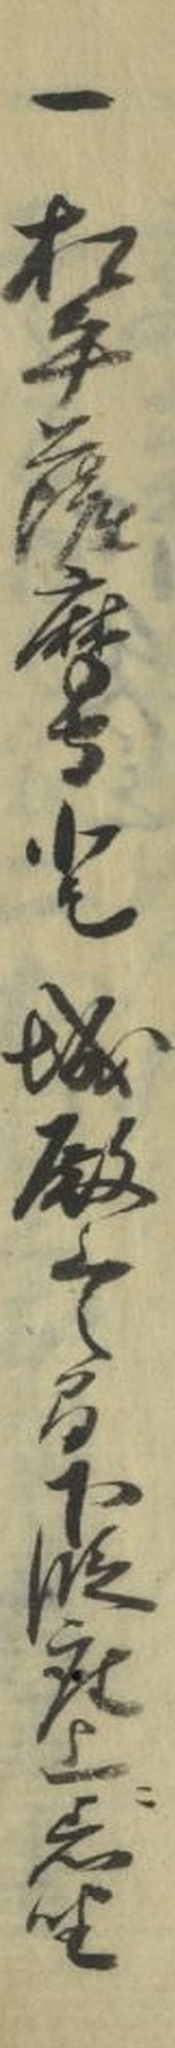一松平薩摩守登城殿上之間下段座上に着座
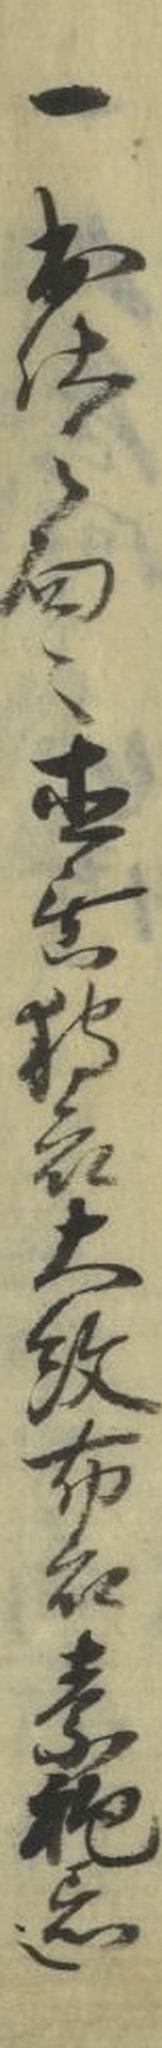一出仕之面々直垂狩衣大紋布衣素袍着之
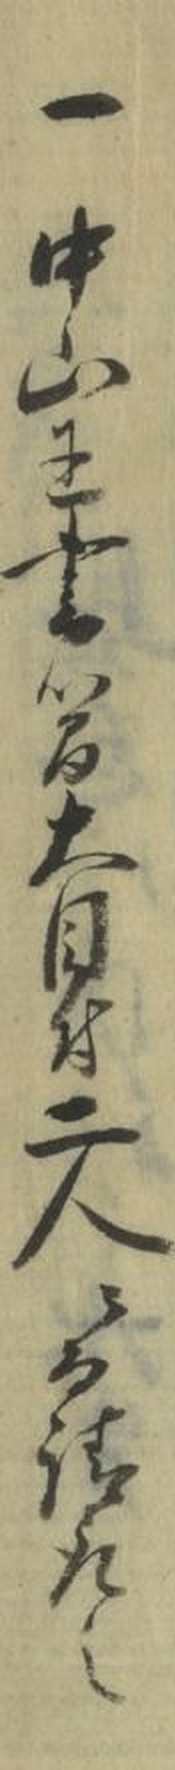一中山王書簡大目付二人にて請取之

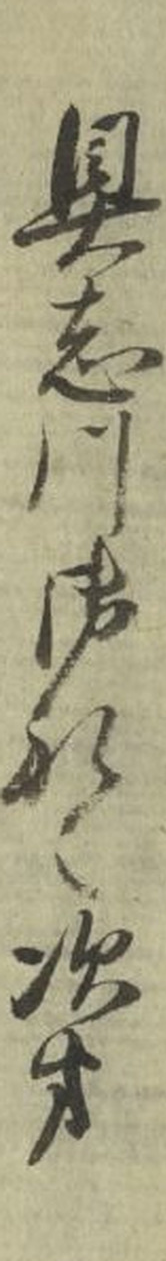具志川御礼之次第
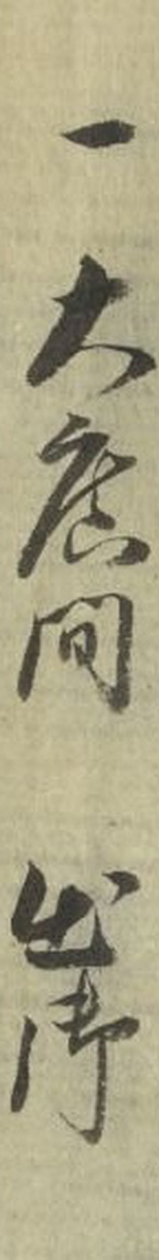一大広間出御
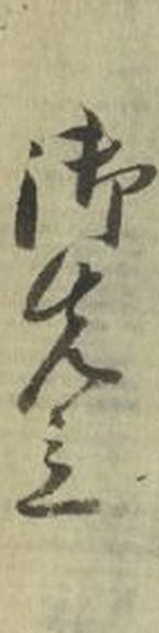御先立
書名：戊辰琉球人来朝之式 全
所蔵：University of the Ryukyus Library
